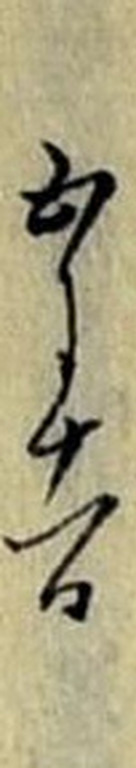五月十一日
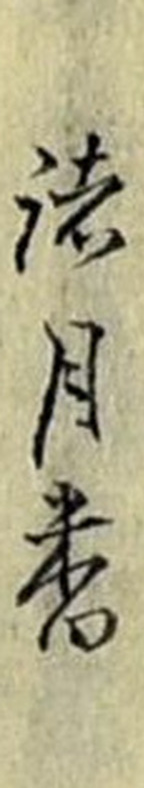諸月番
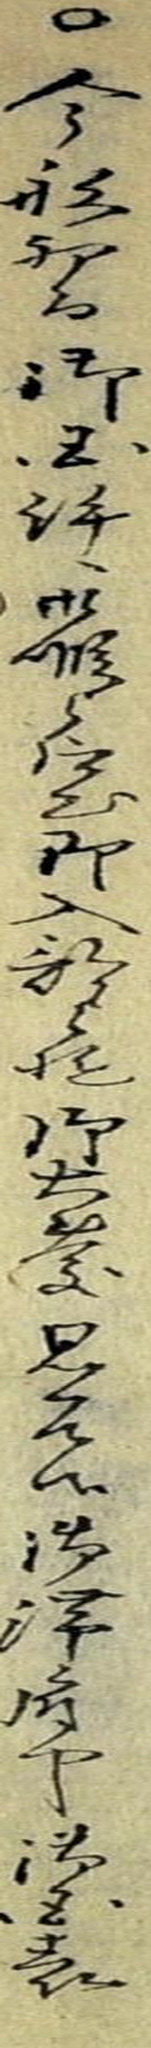○今般初而御国許へ御暇被仰出即入部被遊御大慶思召候御滞府中御国表
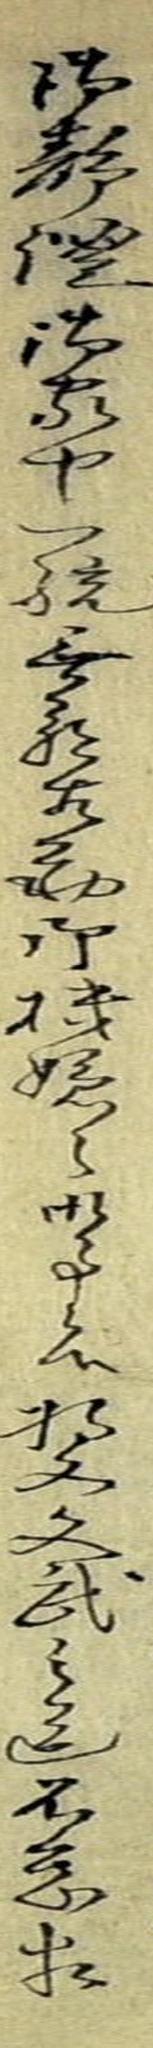御静謐御家中一統無難相勤御機嫌之御事ニ候将又文武之道不怠相
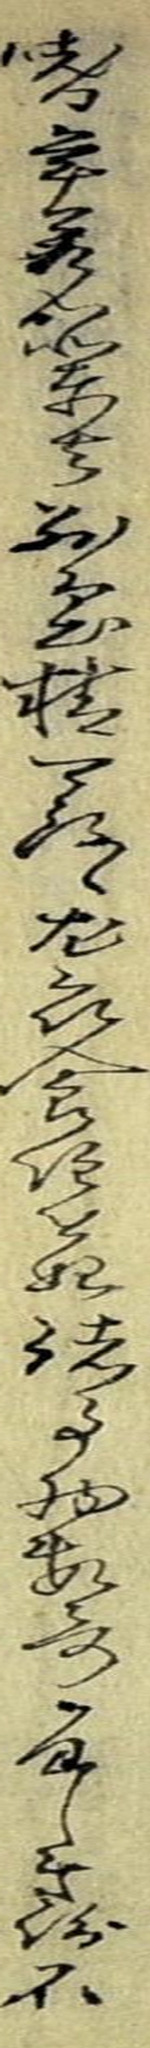嗜年若成輩者別而出精可致候尤衣食住を始諸事物数寄かましキ儀不
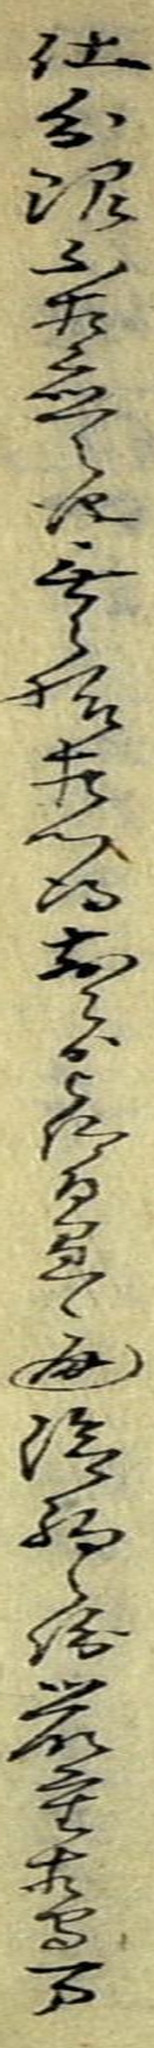仕分限不相応之儀無之様相心得前々ゟ被仰付置候通倹約之儀厳重相守万
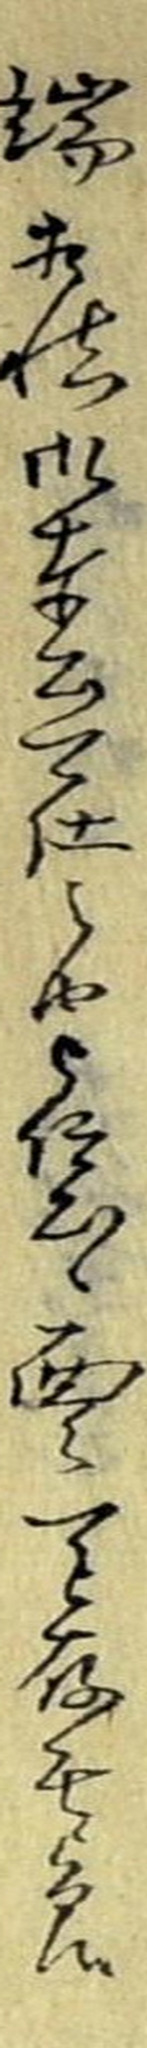端相慎御奉公可仕之由被仰出候面々可被存其旨候

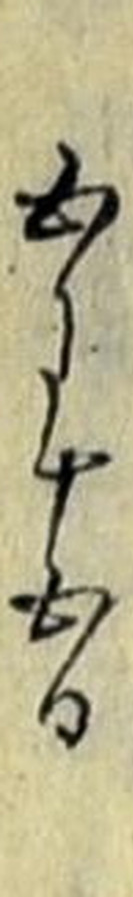五月十六日
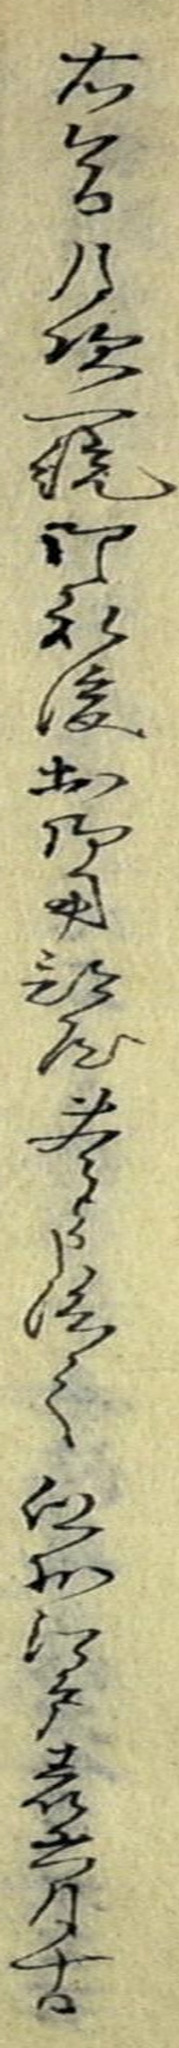右今日月次一統御礼後於御用部屋夫々被申渡之但於江戸表六月十日
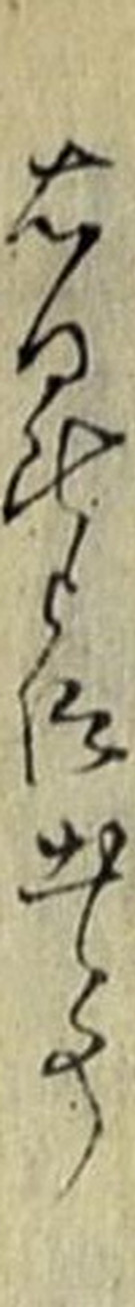右同断被仰出事
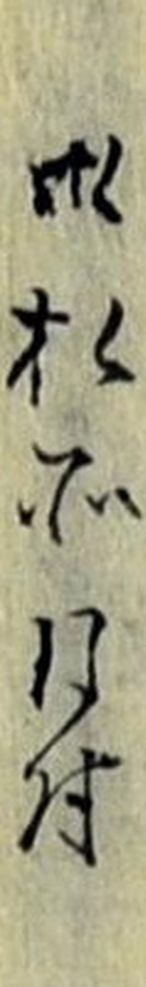御札所目付
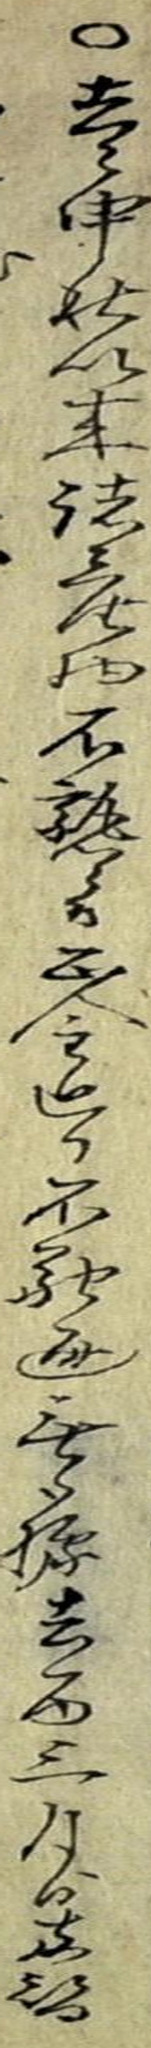○去々申秋以来諸産物不熟ニ付正金廻り不融通無御拠去酉三月ゟ両替
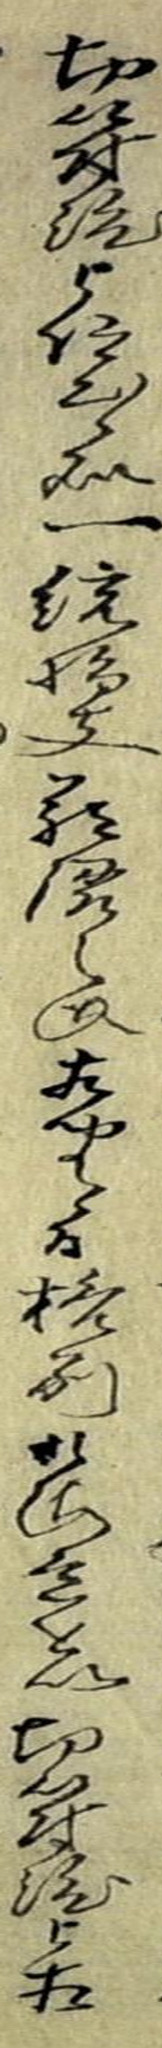切符渡被仰出候処一統指支難渋之趣相聞ニ付格別御趣意を以切符渡被相
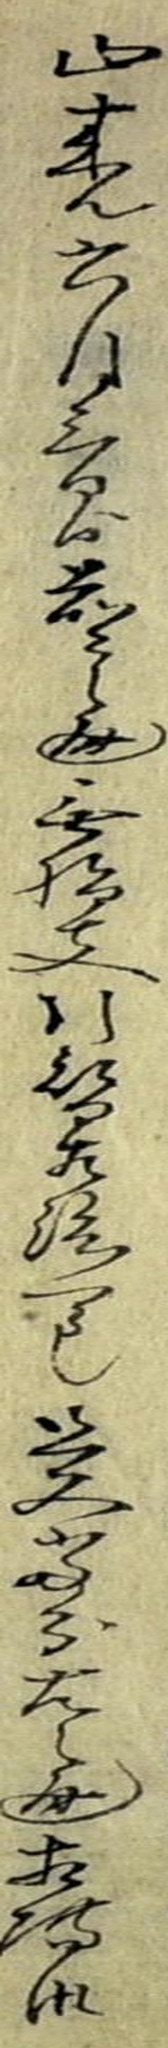止来ル六月三日ゟ前々之通無指支引替相渡可申候且又当分左之通相場御
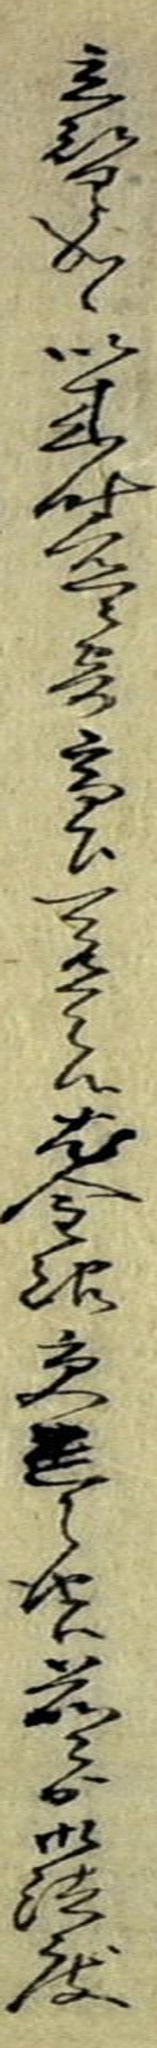立替ニ成候以来時宜ニ寄高下可有之候尤金銀受継之儀ハ前々ゟ御法度
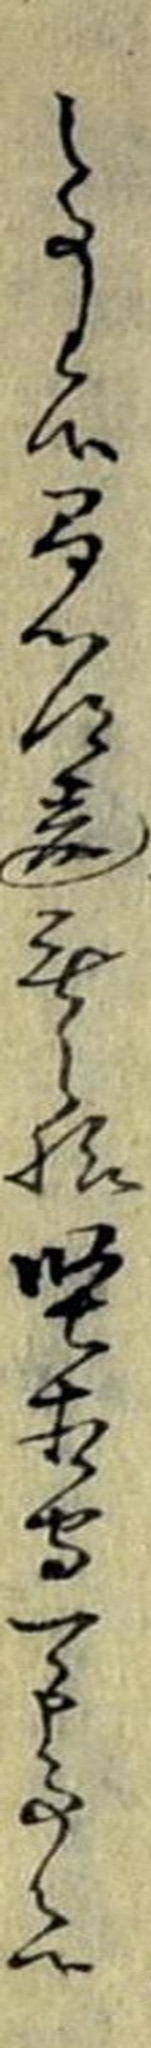之事ニ候間心得違無之様堅相守可申事ニ候
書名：命令之部 五
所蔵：福井県文書館 Fukui Prefectural Archives
